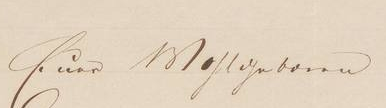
Euer Wohlgeboren
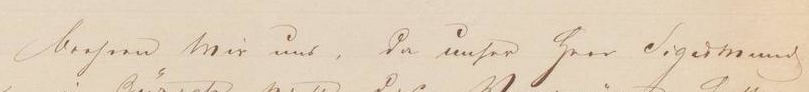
beehren wir uns, da unser Herr Sigismund
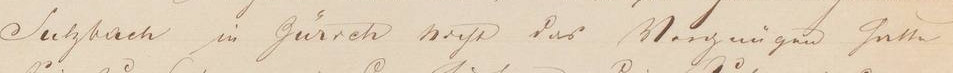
Sulzbach in Zürich nicht das Vergnügen hatte
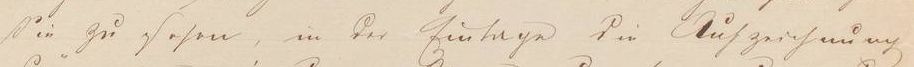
Sie zu sehen, in der Einlage die Aufzeichnung
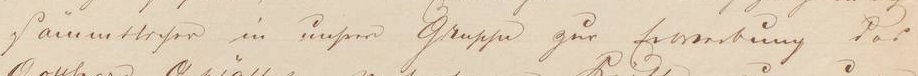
sämmtlicher in unsrer Gruppe zur Erwerbung des
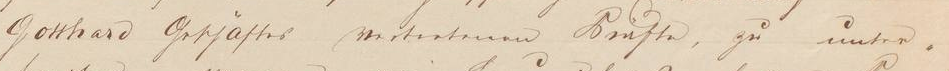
Gotthard Geschäftes vertretenen Kräfte, zu unter-
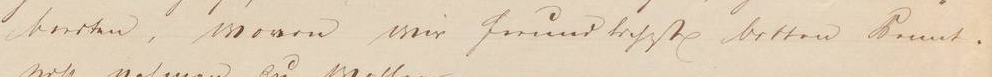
breiten, wovon wir freundlichst bitten Kennt-
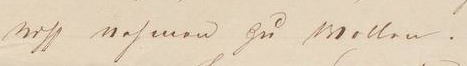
niss nehmen zu wollen.
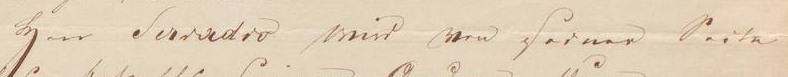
Herr Servadio wird von seiner Seite
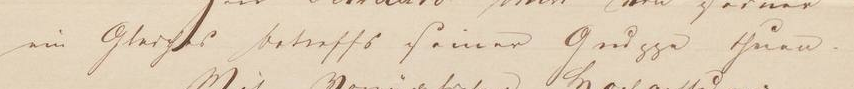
ein Gleiches betreffs seiner Gruppe thuen.
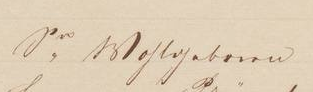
Sr Wohlgeboren
